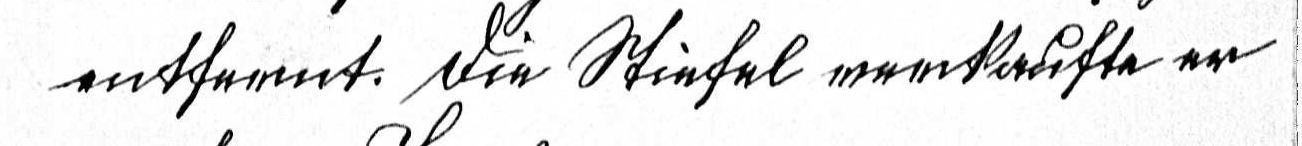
entfernt. Die Stiefel verkaufte er
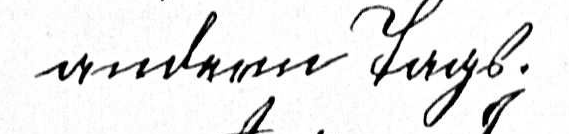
andern Tags.
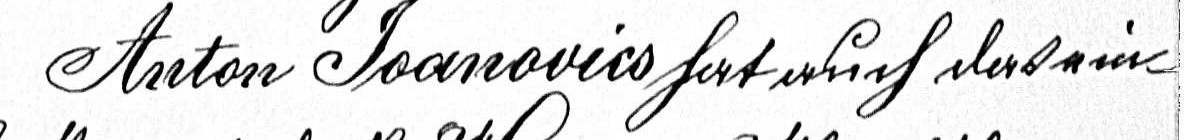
Anton Ioanovics hat auch das ein¬
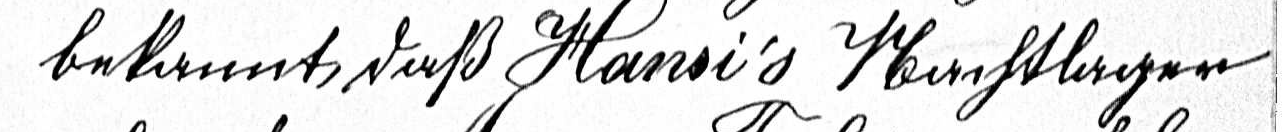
bekannt, daß Hansi’s Nachtlager
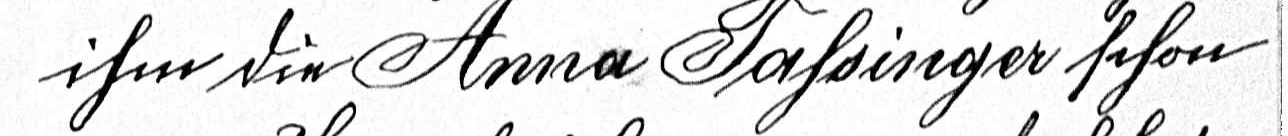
ihm die Anna Tassinger schon
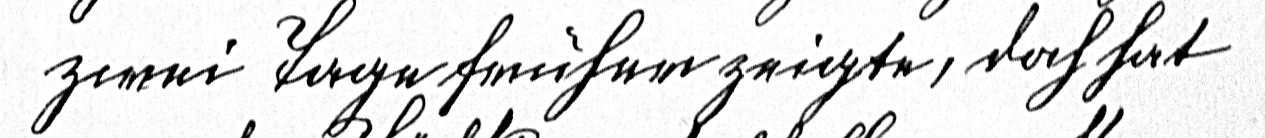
zwei Tage früher zeigte, doch hat
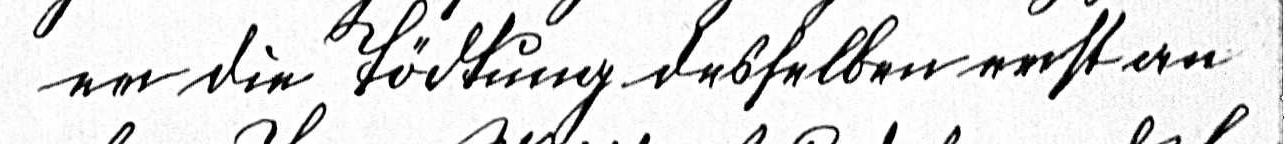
er die Tödtung desselben erst an
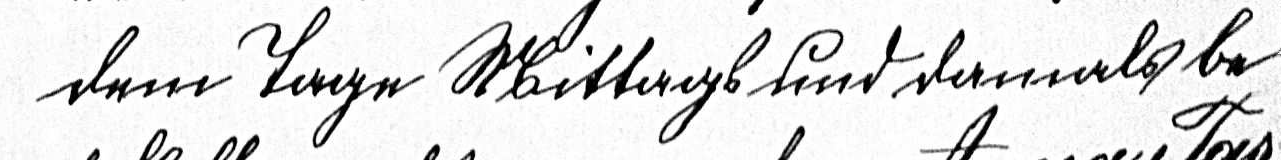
dem Tage Mittags und damals be¬
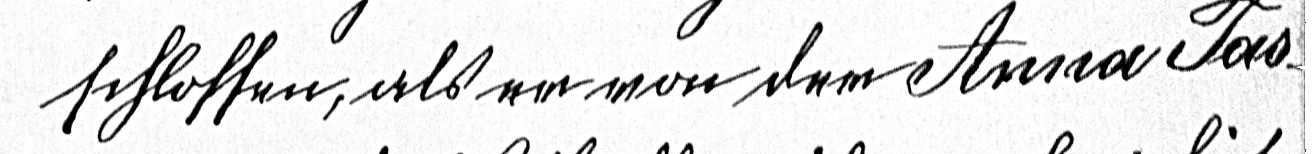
schlossen, als er von der Anna Tas¬
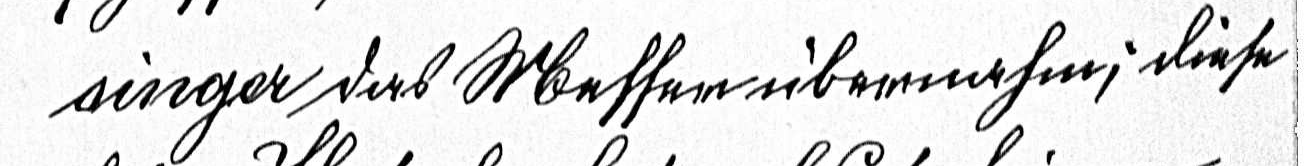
singer das Messer übernahm, diese
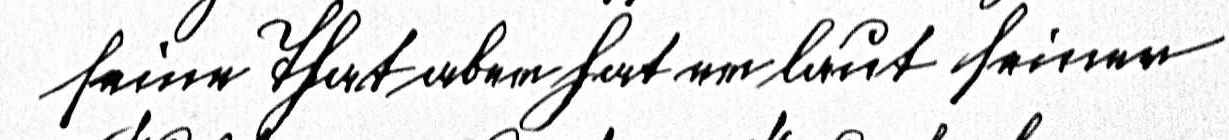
seine That aber hat er laut seiner
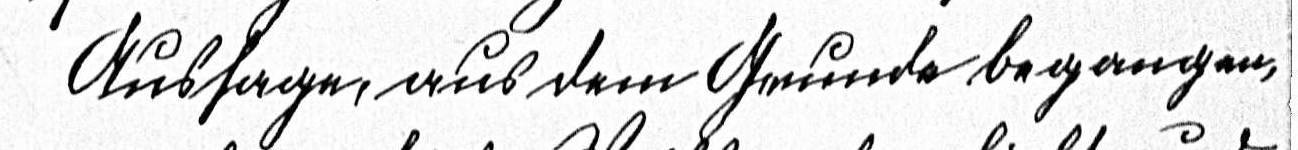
Aussage, aus dem Grunde begangen,
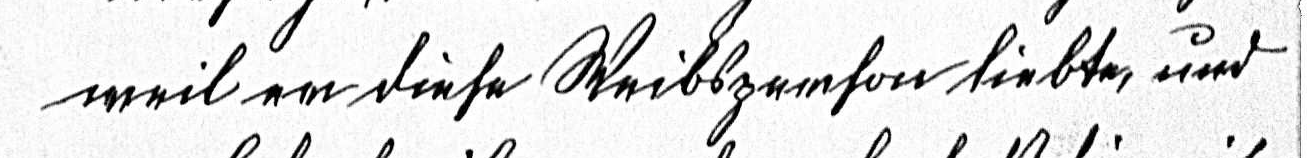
weil er diese Weibsperson liebte, und
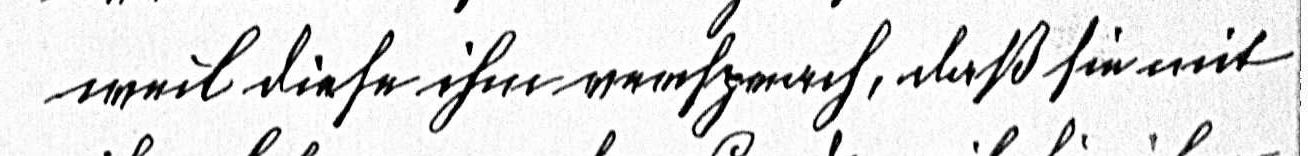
weil diese ihm versprach, daß sie mit
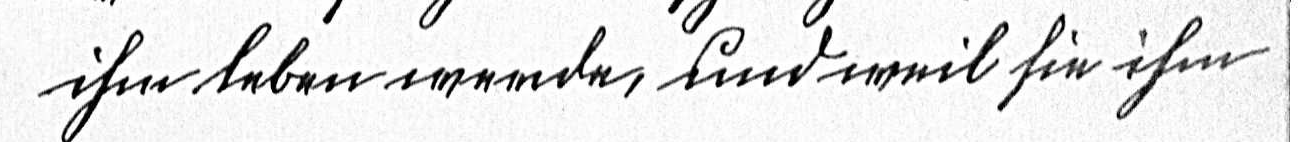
ihm leben werde, und weil sie ihm
